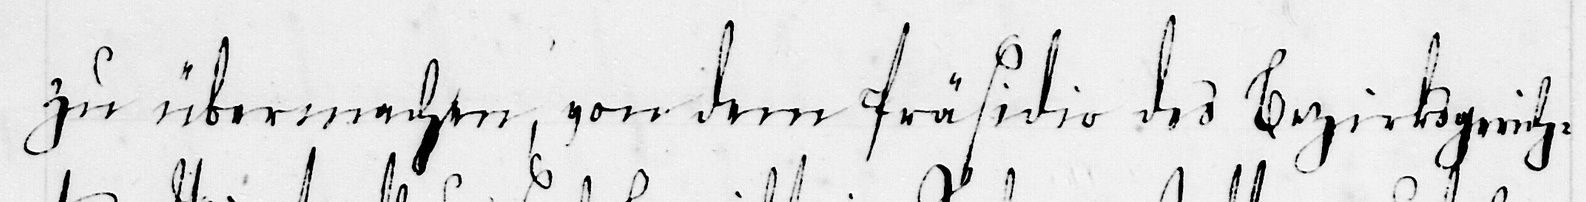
zu übermachen, von dem Präsidio des Bezirksgerich¬
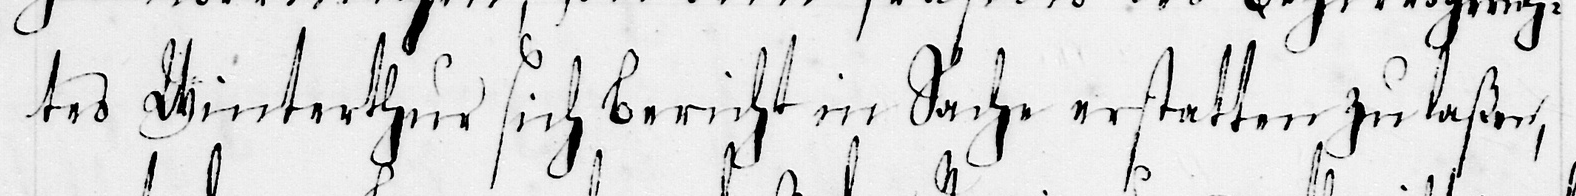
tes Winterthur sich Bericht in Sache erstatten zu laßen,
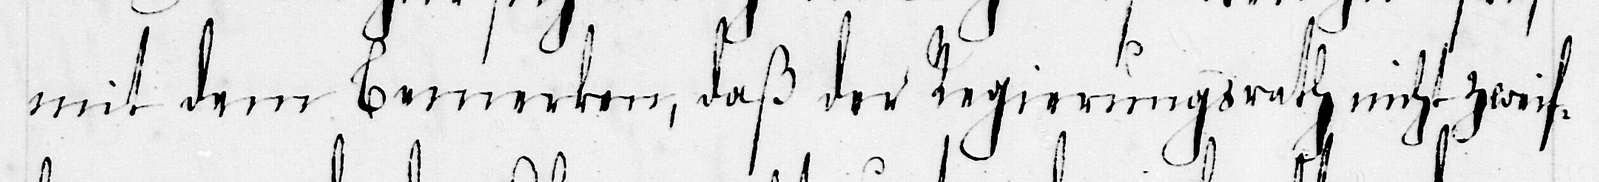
mit dem Bemerken, daß der Regierungsrath nicht zweif¬
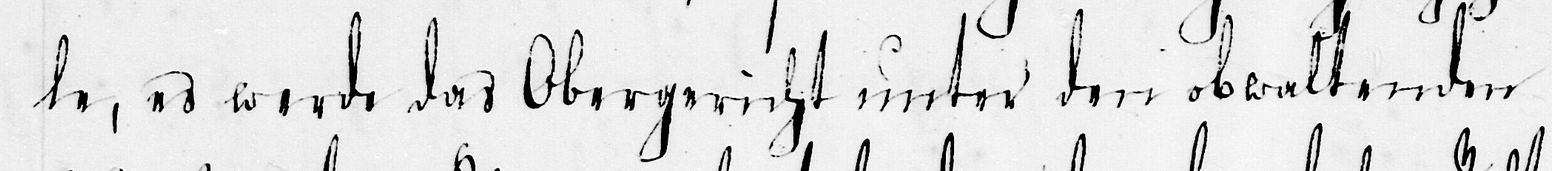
le, es werde das Obergericht unter den obwaltenden
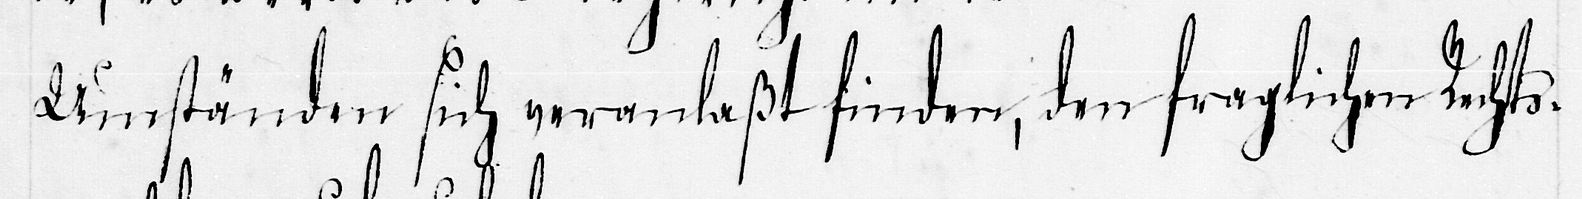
Umständen sich veranlaßt finden, den fraglichen Recht¬
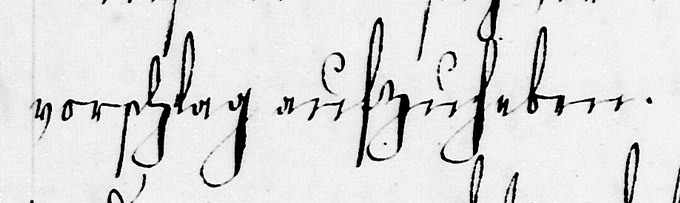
vorschlag aufzuheben.
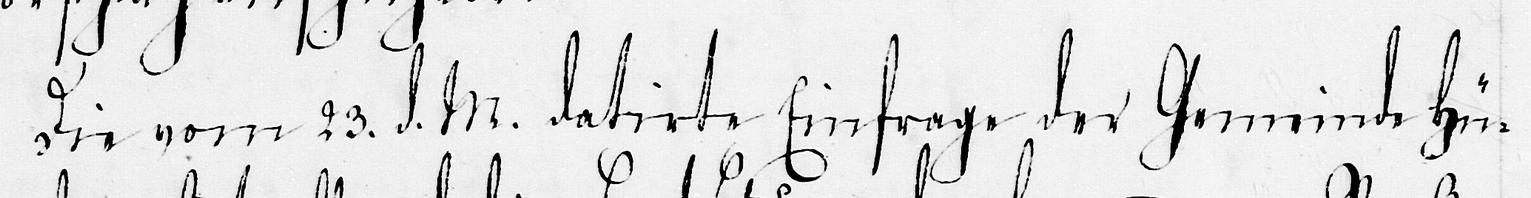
Die vom 23. d. M. datirte Einfrage der Gemeinde Hün¬
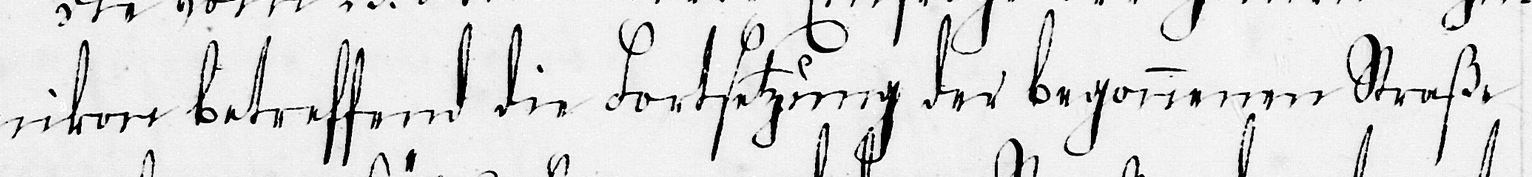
ikon betreffend die Fortsetzung der begonnenen Straße
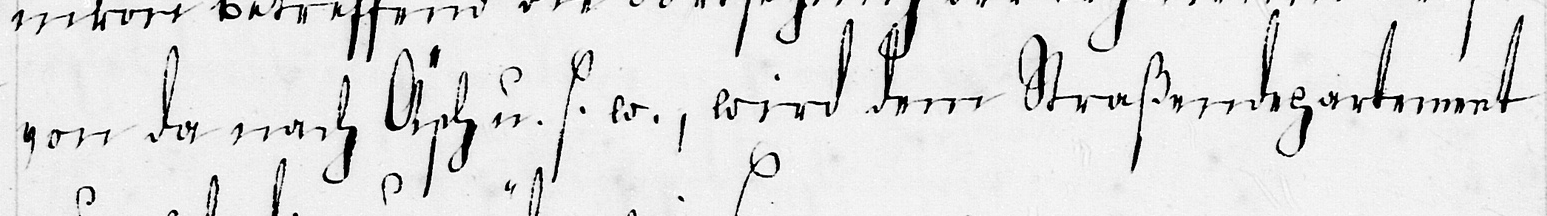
von da nach Äsch u. s. w., wird dem Straßendepartement
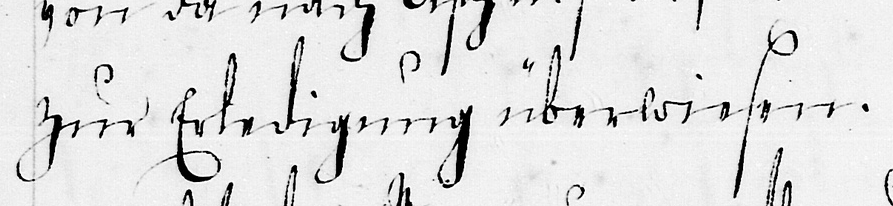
zur Erledigung überwiesen.
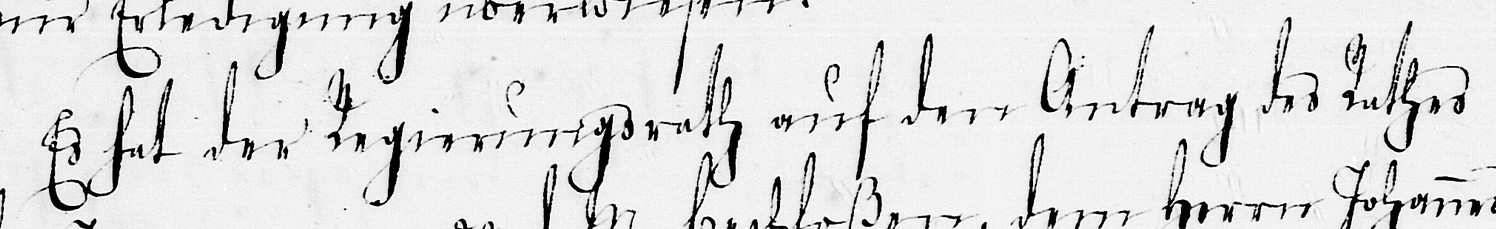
Es hat der Regierungsrath auf den Antrag des Rathes
